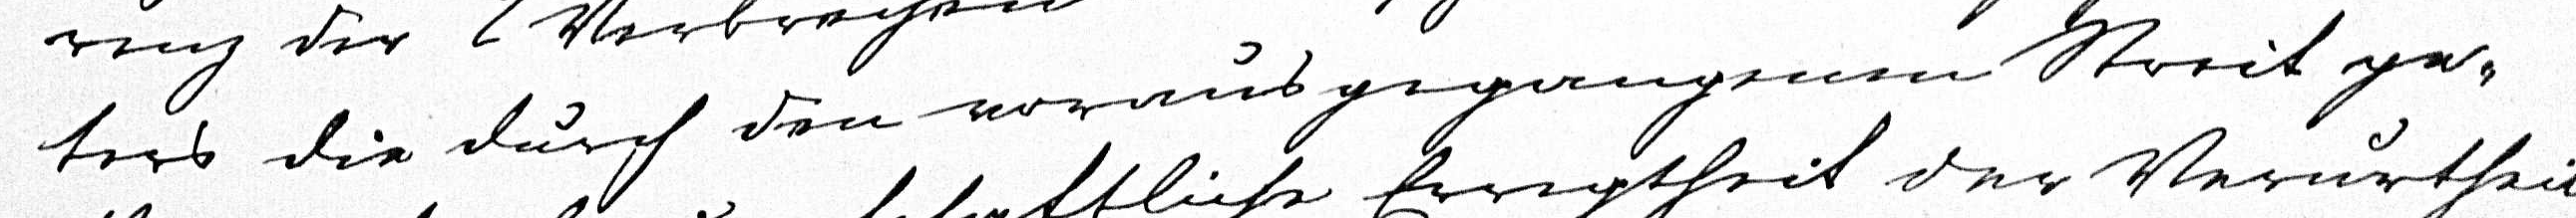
ters die durch den vorausgegangenen Streit ge¬
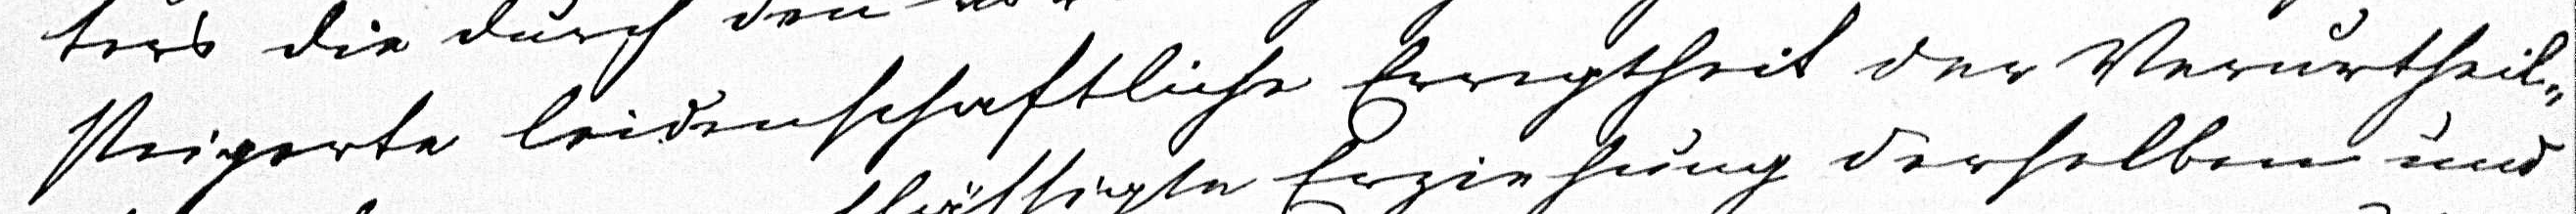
steigerte leidenschaftliche Erregtheit der Verurtheil¬
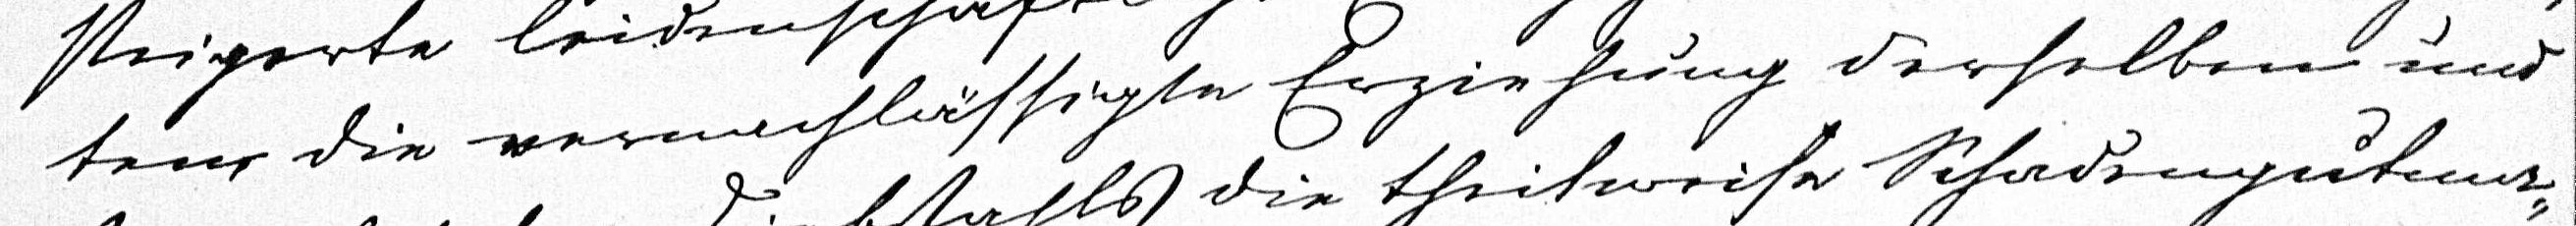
ten die vernachlässigte Erziehung derselben und
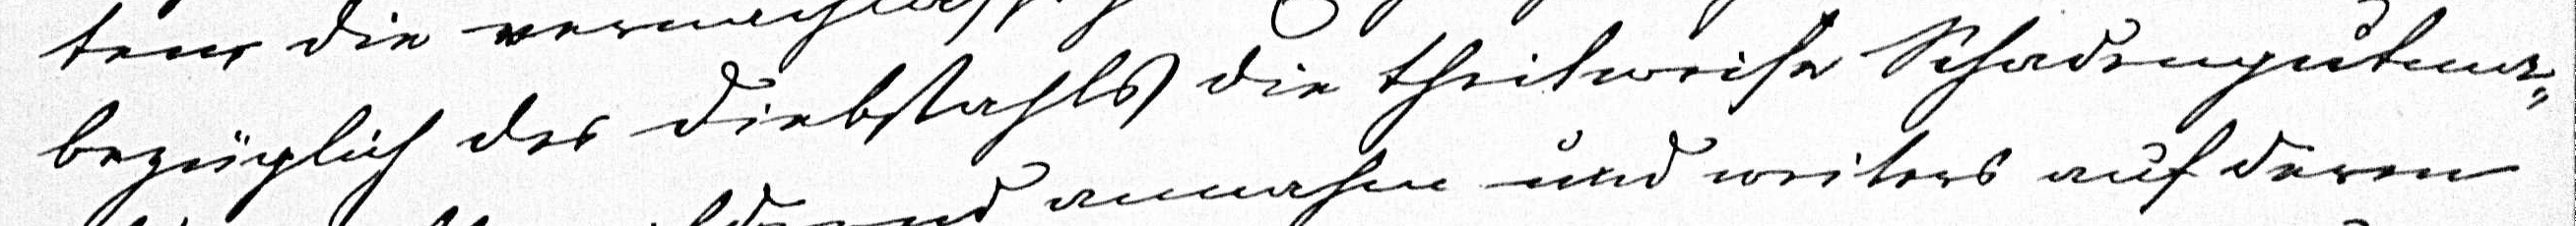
bezüglich des Diebstahles die theilweise Schadengutma¬
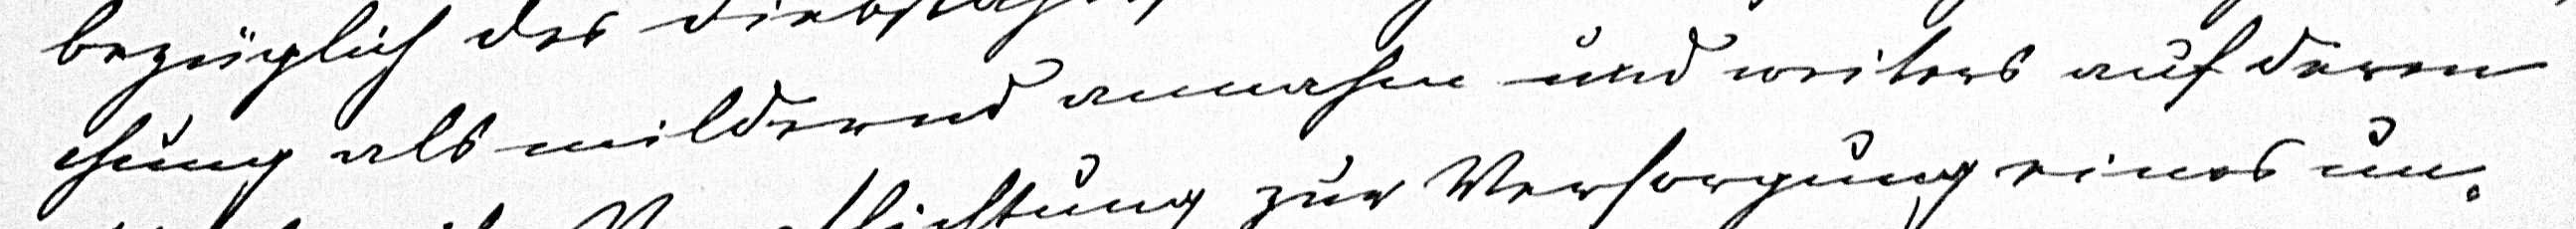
chung als mildernd annahm und weiters auf deren
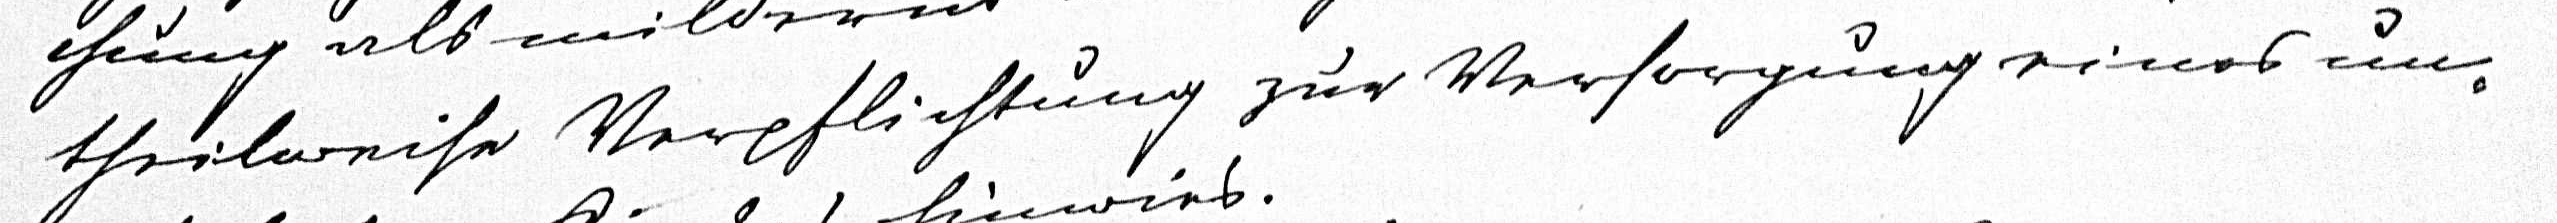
theilweise Verpflichtung zur Versorgung eines un¬
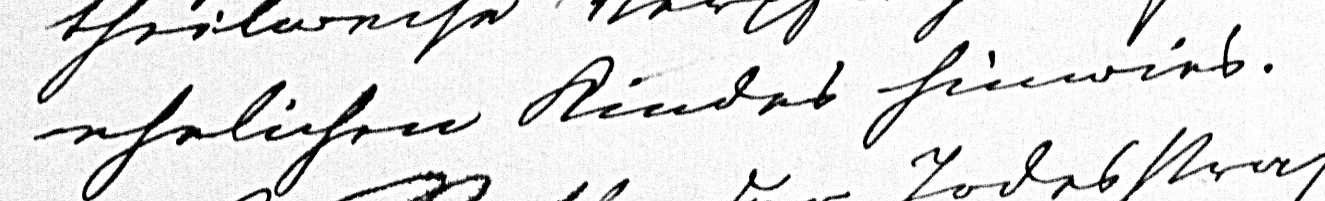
ehelichen Kindes hinwies.
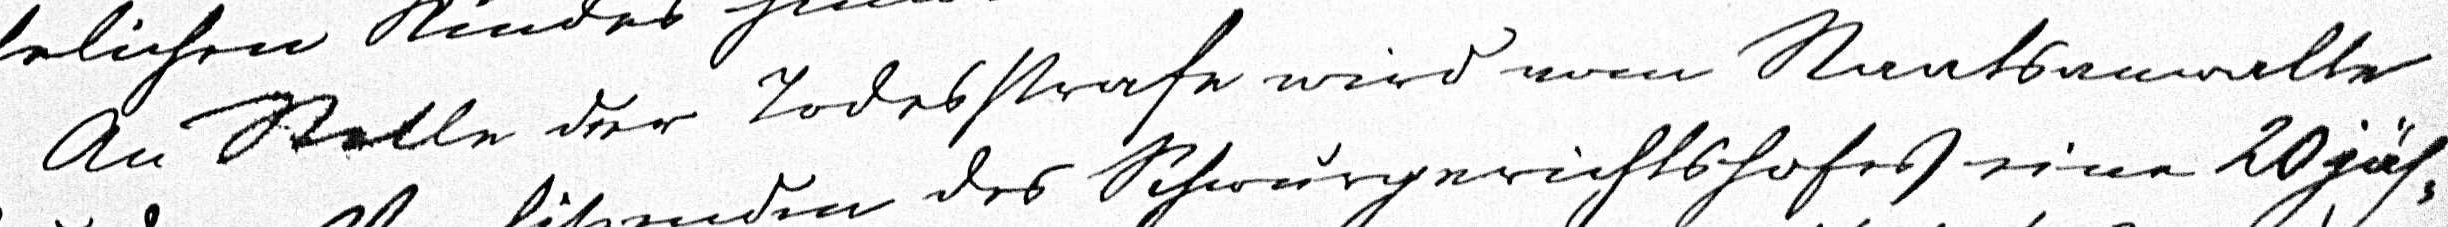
An Stelle der Todesstrafe wird vom Staatsanwalte
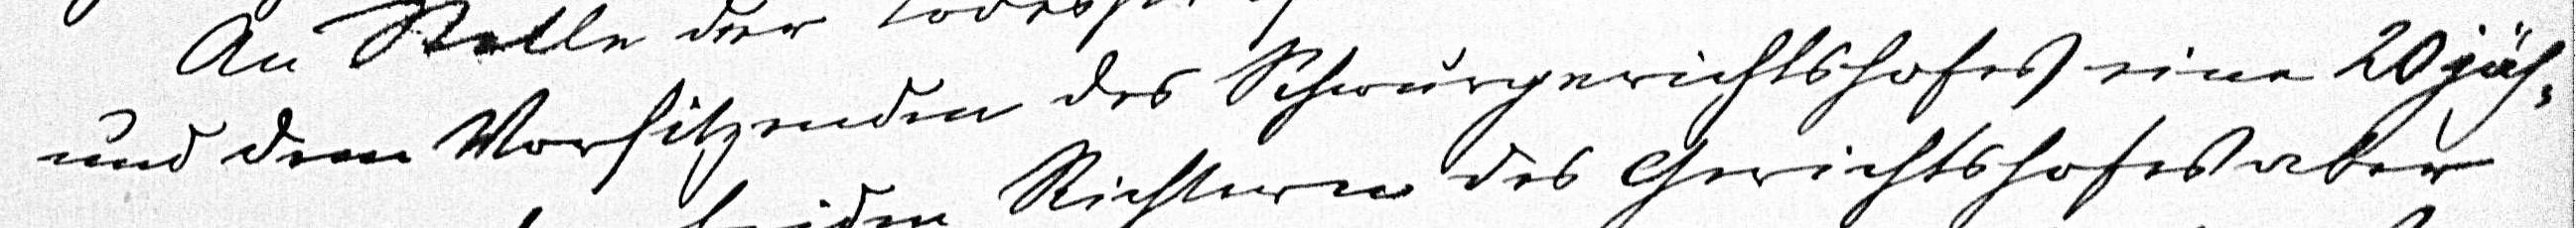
und dem Vorsitzenden des Schwurgerichtshofes eine 20jäh¬
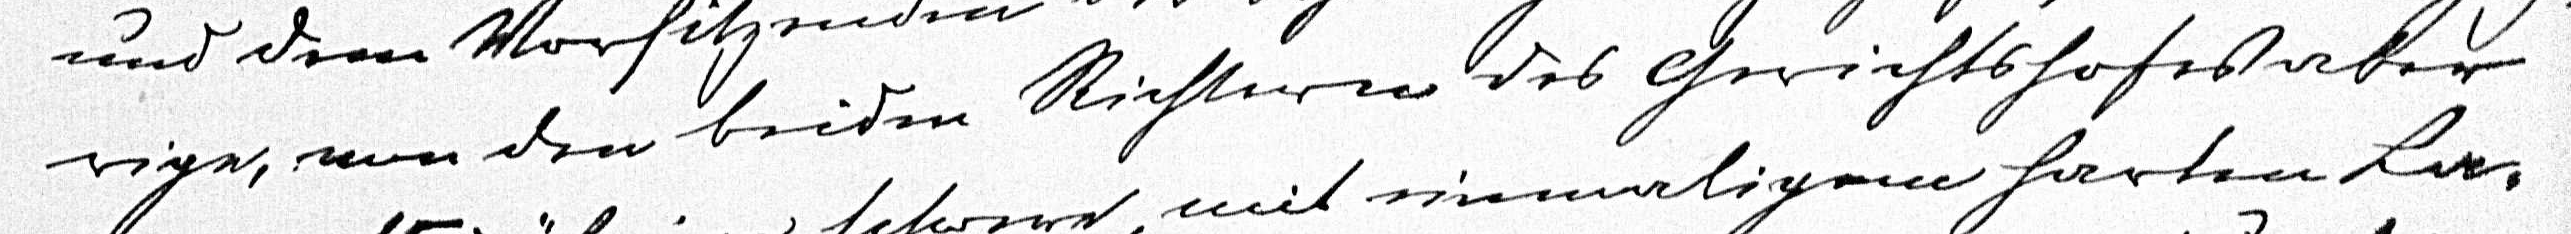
rige, von den beiden Richtern des Gerichtshofesaber
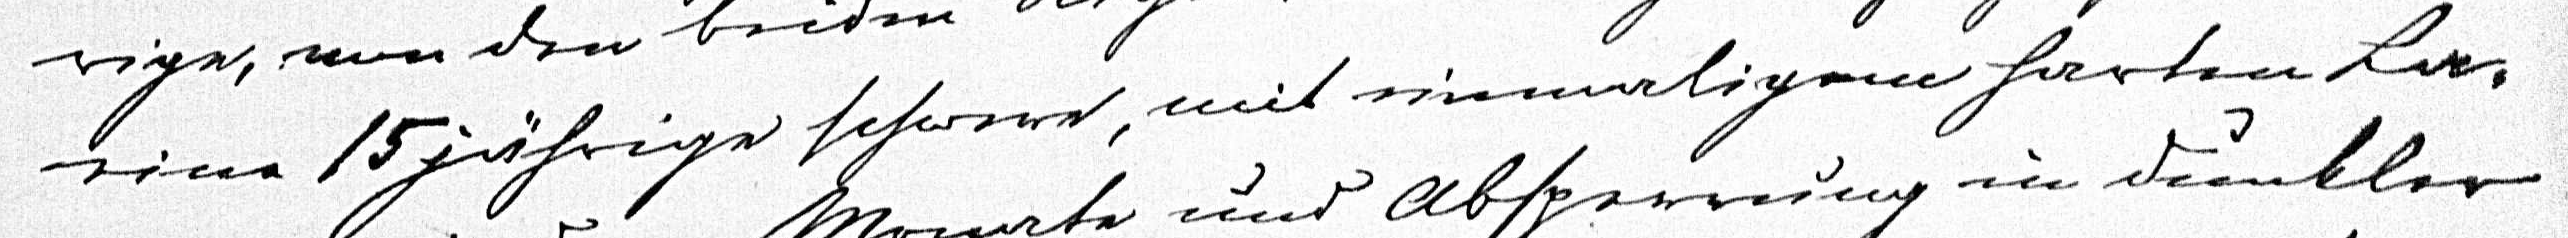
eine 15jährige schwere, mit einmaligen harten La¬
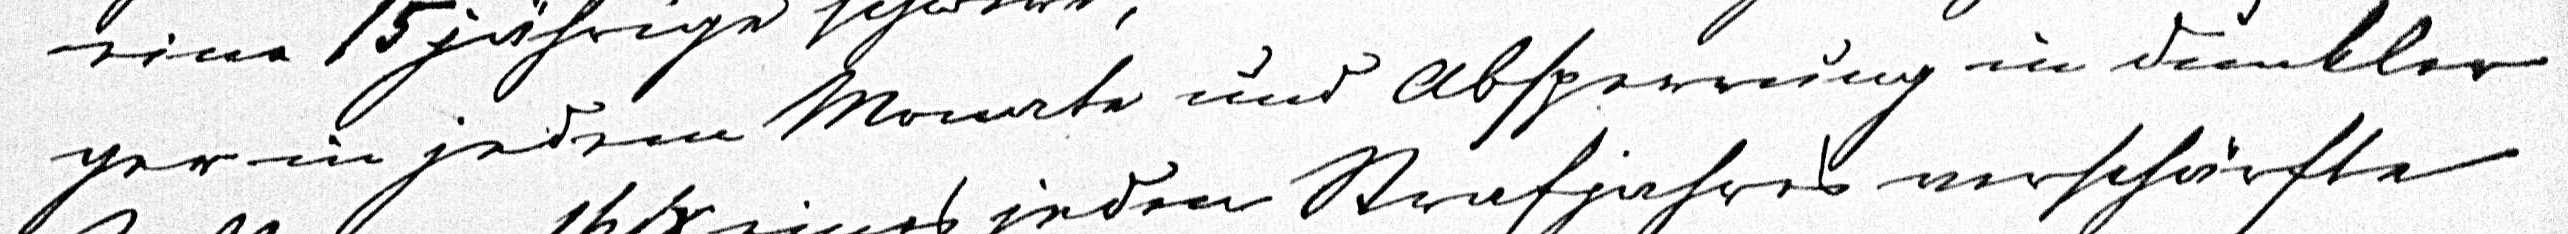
ger in jedem Monate und Absperrung in dunkler
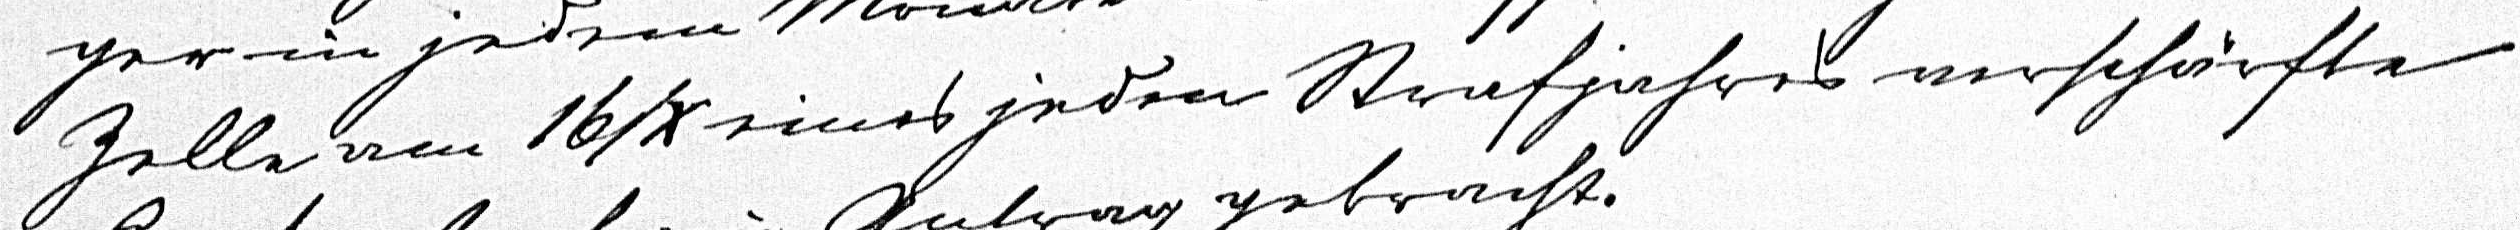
Zelle am 16/X eines jeden Strafjahres verschärfte
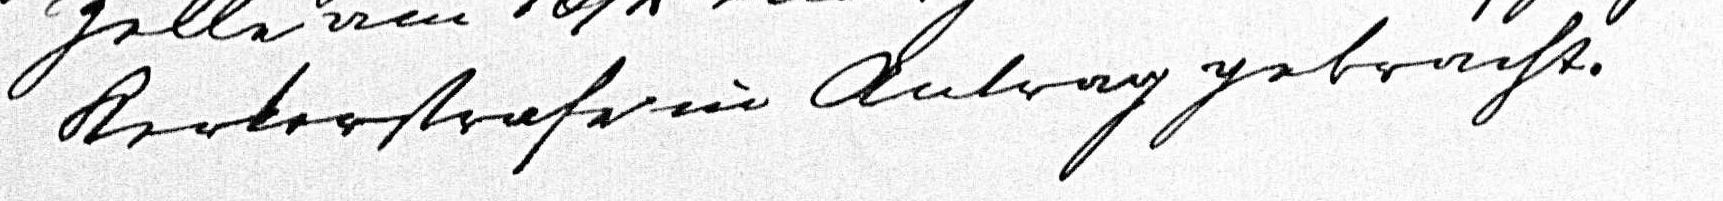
Kerkerstrafe in Antrag gebracht.
